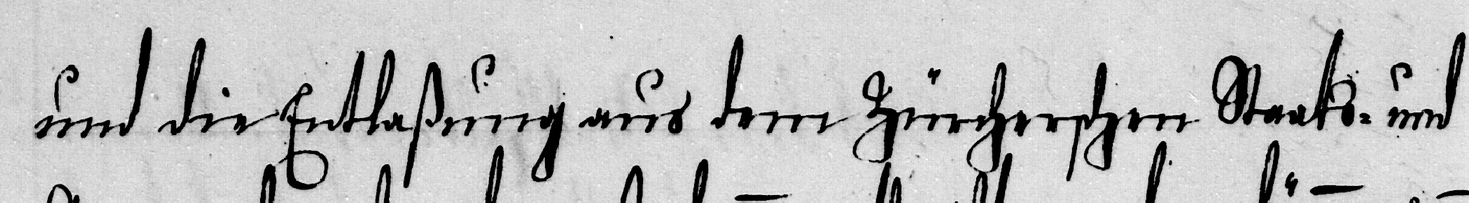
und die Entlaßung aus dem Zürcherschen Staats- und
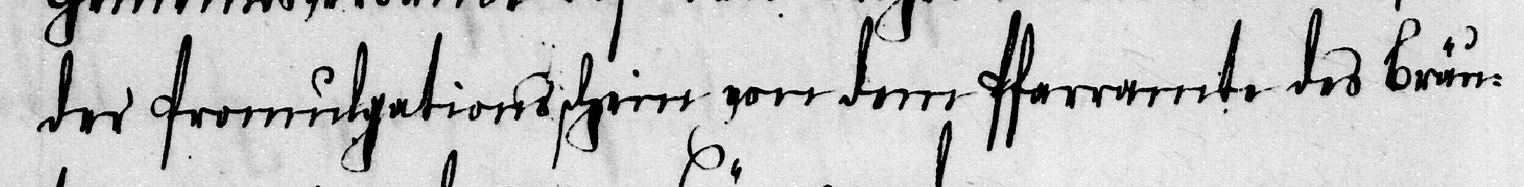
der Promulgationsschein von dem Pfarramte des Bräu¬
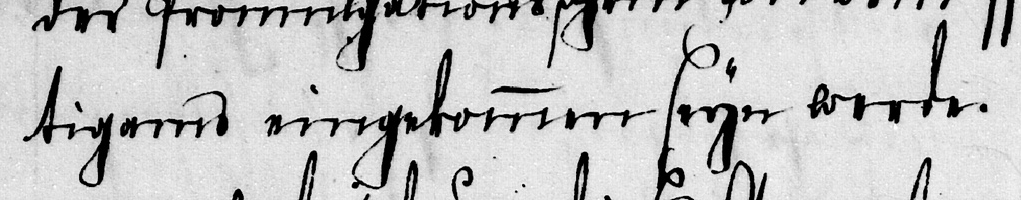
tigams eingekommen seyn werde.
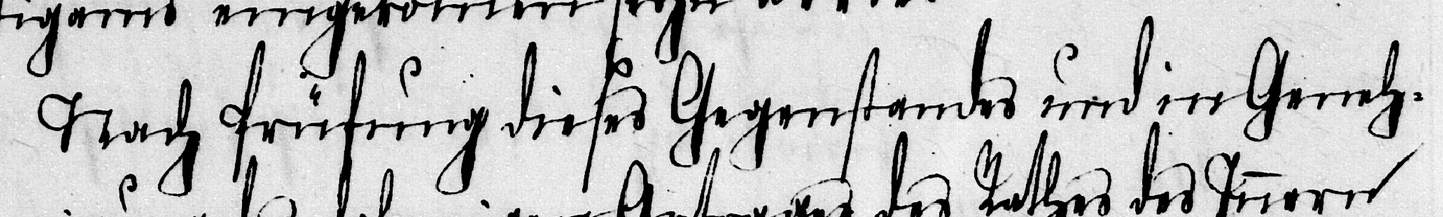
Nach Prüfung dieses Gegenstandes und in Geneh¬
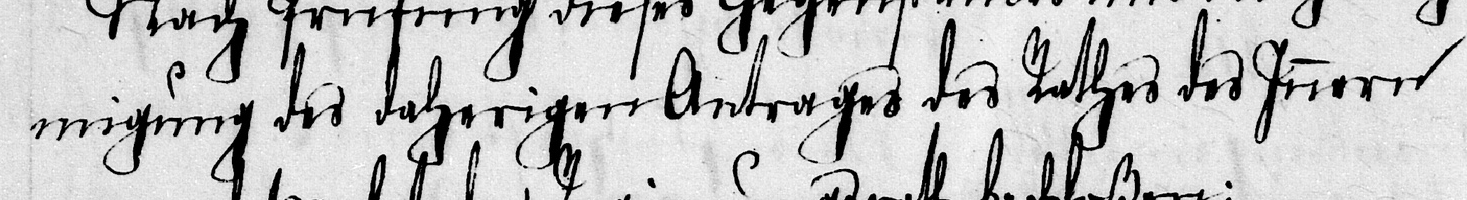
migung des daherigen Antrages des Rathes des Innern
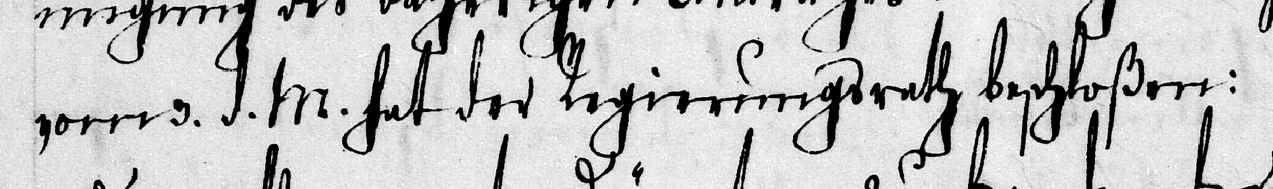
vom 3. d. M. hat der Regierungsrath beschloßen:
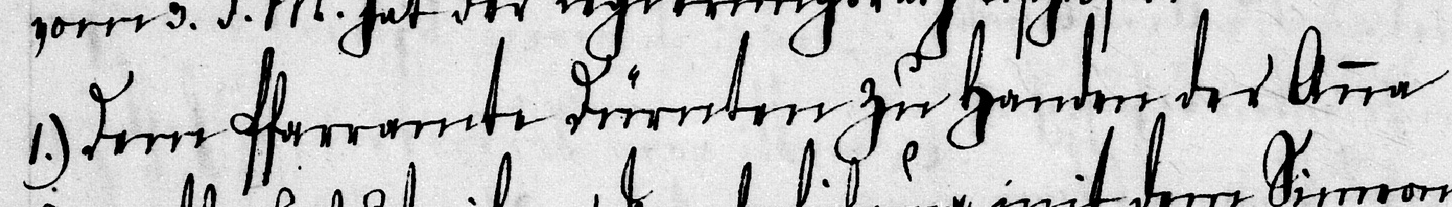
1.) Dem Pfarramte Dürnten zu Handen der Anna
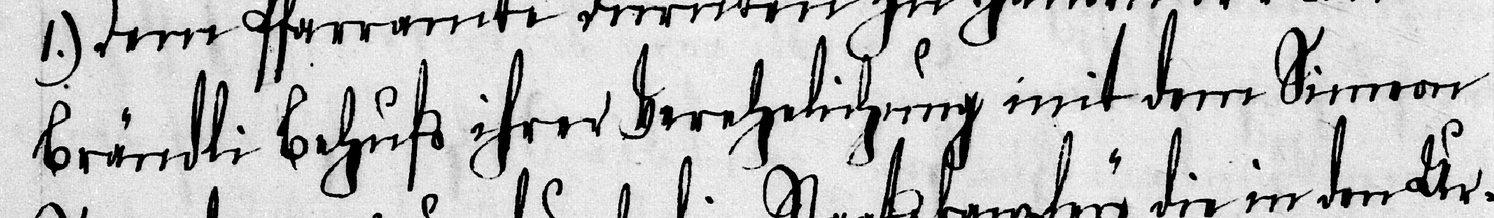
Brändli Behufs ihrer Verehelichung mit dem Simeon
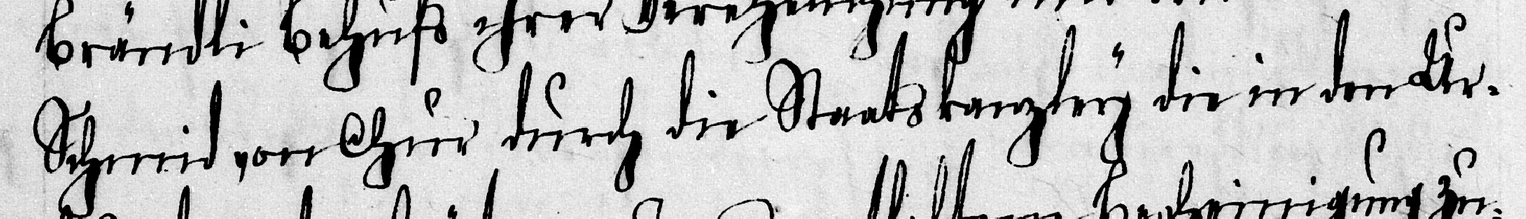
Schmid von Chur durch die Staatskanzley die in den Ur¬
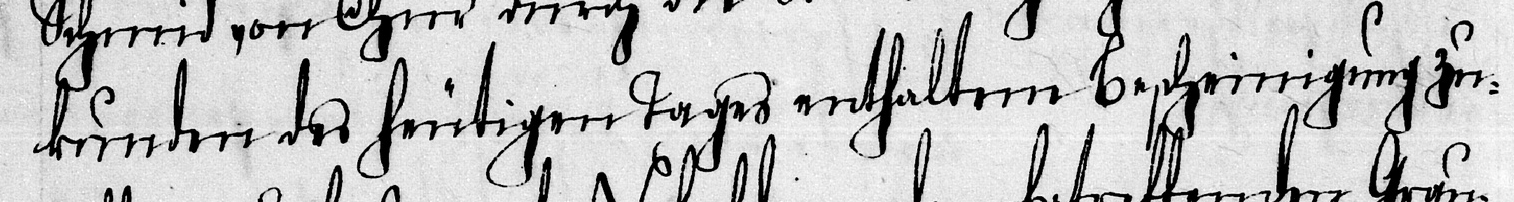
kunden des heutigen Tages enthaltene Bescheinigung zus¬
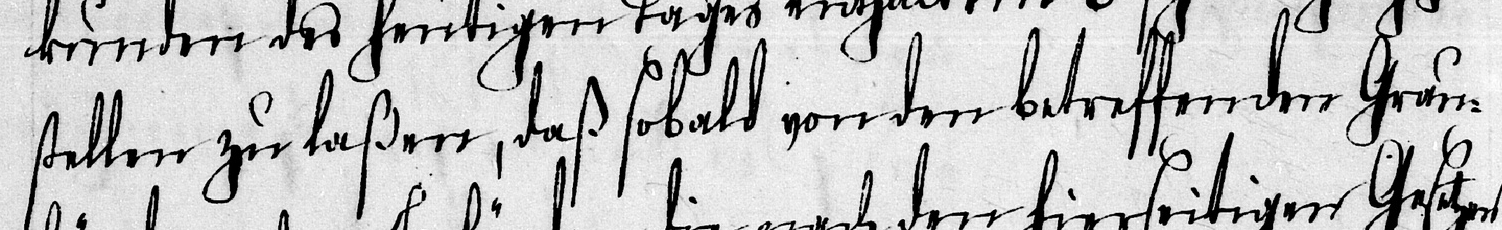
tellen zu laßen, daß sobald von den betreffenden Grau¬
